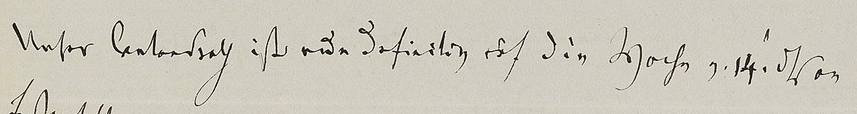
Unser Cantonsrath ist nun definitiv auf die Woche v. 14t dss an
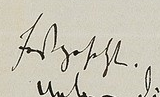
festgesetzt.
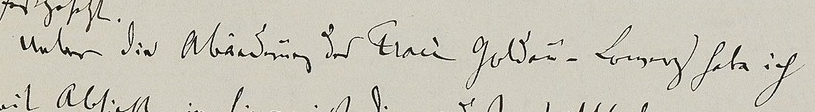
Ueber die Abänderung des Tracè Goldau–Lowerz habe ich
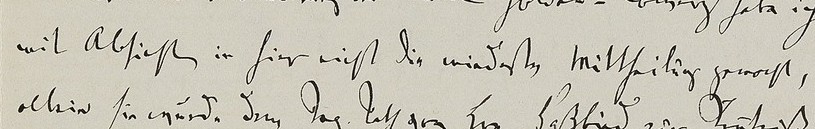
mit Absicht in hier nicht die mindeste Mittheilung gemacht,
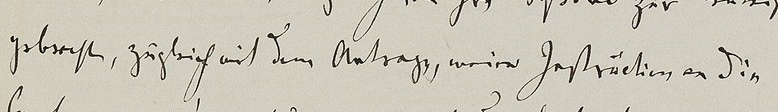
gebracht, zugleich mit dem Antrage, meine Instructionen an die
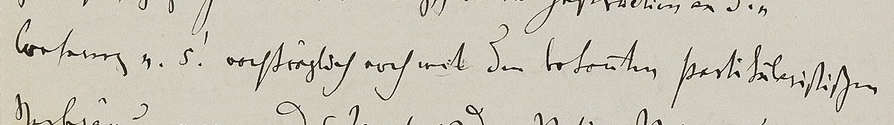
Conferenz v. 5t nachträglich noch mit den bekannten partikularistischen
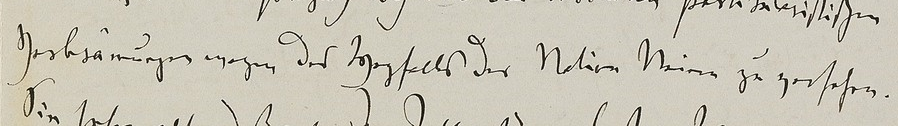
Verbrämungen wegen des Wegfalls der Station Steinen zu versehen.
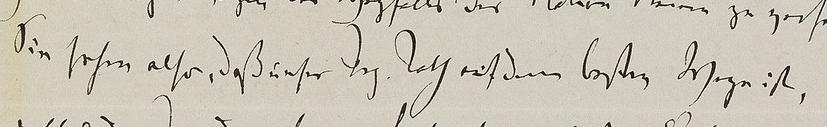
Sie sehen also, daß unser Reg.Rath auf dem besten Wege ist,
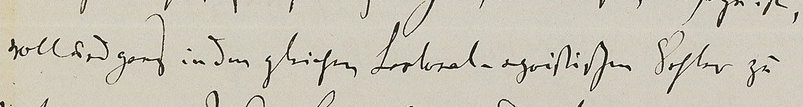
voll und ganz in den gleichen kantonal-egoistischen Fehler zu
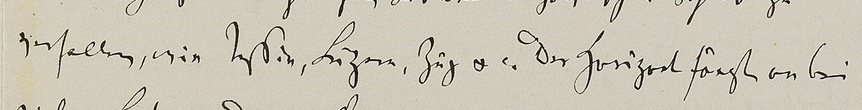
verfallen, wie Tessin, Luzern, Zug &c. Der Horizont fängt an bei
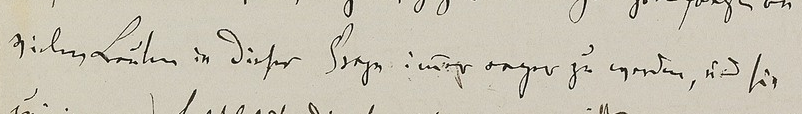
vielen Leuten in dieser Frage immer enger zu werden, und sie
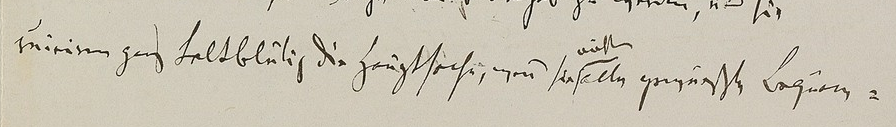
ruiniren ganz kaltblütig die Hauptsache, wenn sie nicht alle gewünschte Bequem-
